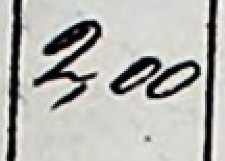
2,00
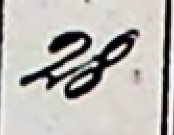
28
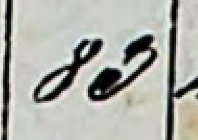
83
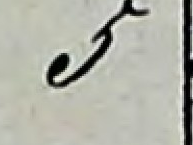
5
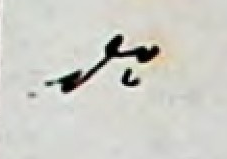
do
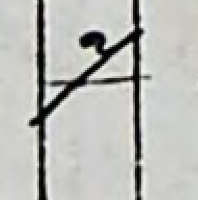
7
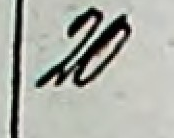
20
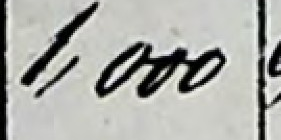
1,000
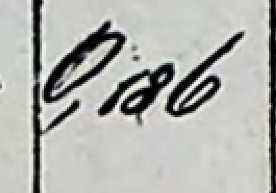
0,186
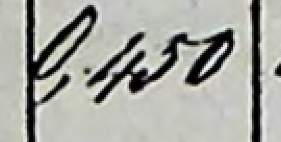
0,450
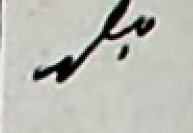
do
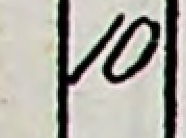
10
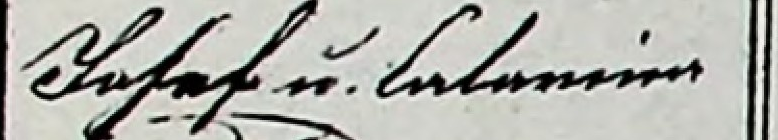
Josef u. Catarina
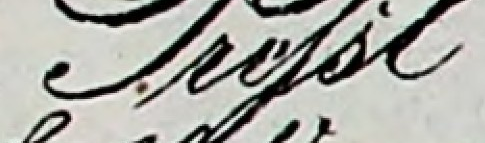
Pressl
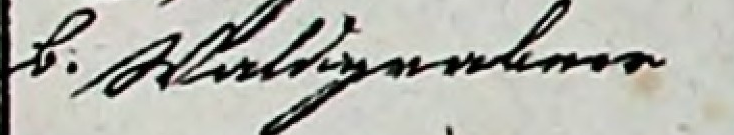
v. Waldgrabner
